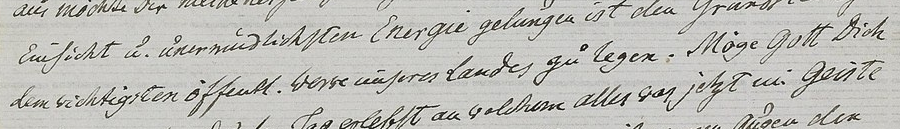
dem wichtigsten öffentl. Werke unseres Landes zu legen. Möge Gott Dich
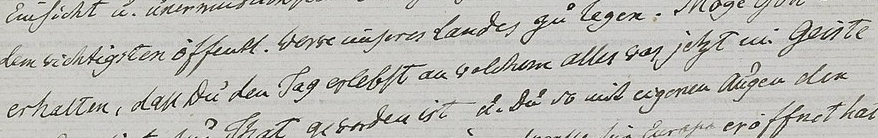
erhalten, dass Du den Tag erlebst an welchem alles was jetzt im Geiste
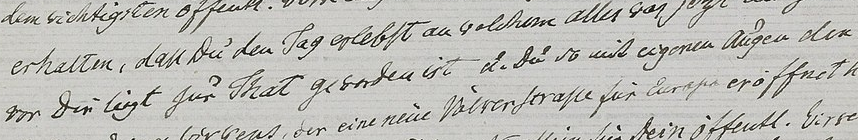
vor Dir liegt zur That geworden ist u. Du so mit eigenen Augen den
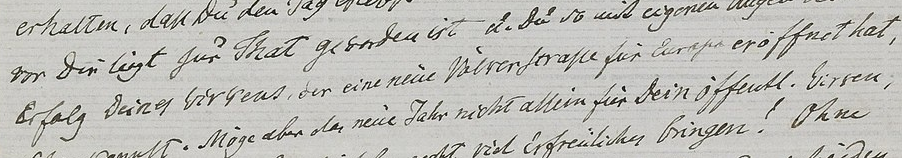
Erfolg Deines Wirkens, der eine neue Völkerstrasse für Europa eröffnet hat,
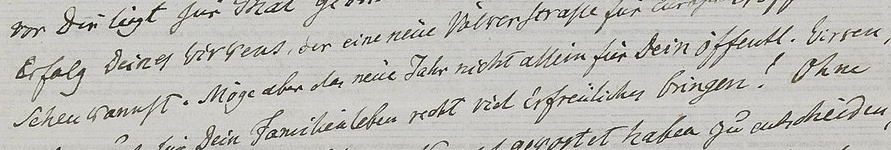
sehen kannst. Möge aber das neue Jahr nicht allein für Dein öffentl. Wirken,
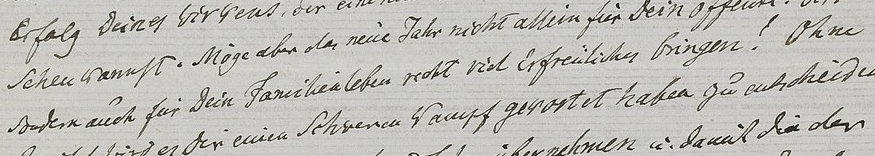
sondern auch für Dein Familienleben recht viel Erfreuliches bringen! Ohne
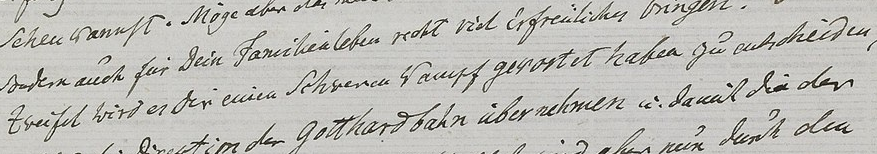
Zweifel wird es Dir einen schweren Kampf gekostet haben zu entscheiden,
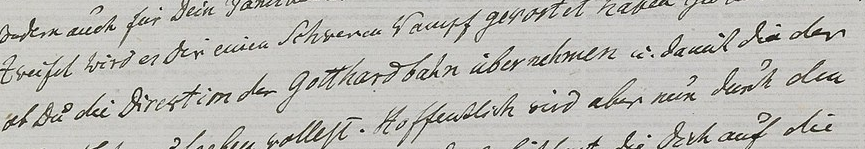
ob Du die Direktion der Gotthardbahn übernehmen u. damit die der
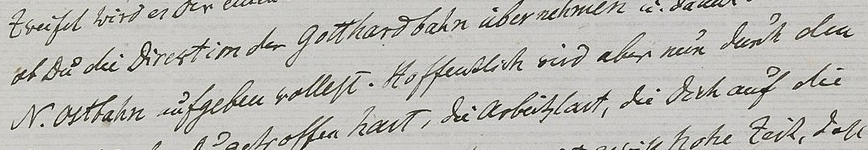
N.Ostbahn aufgeben wollest. Hoffentlich wird aber nun durch den
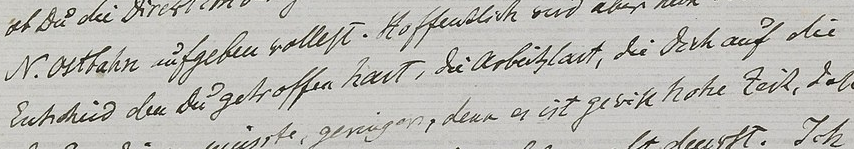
Entscheid den Du getroffen hast, die Arbeitslast, die Dich auf die
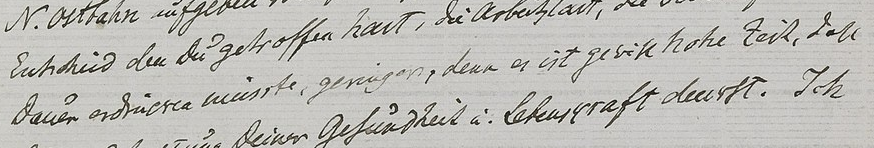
Dauer erdrücken müsste, genügen; denn es ist gewiss hohe Zeit, dass
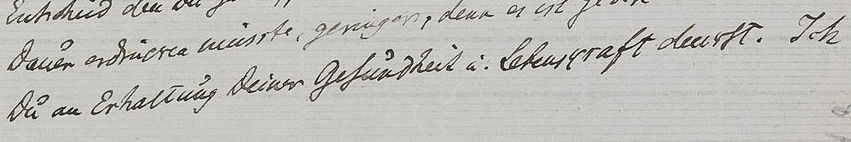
Du an Erhaltung Deiner Gesundheit u. Lebenskraft denkst. Ich
